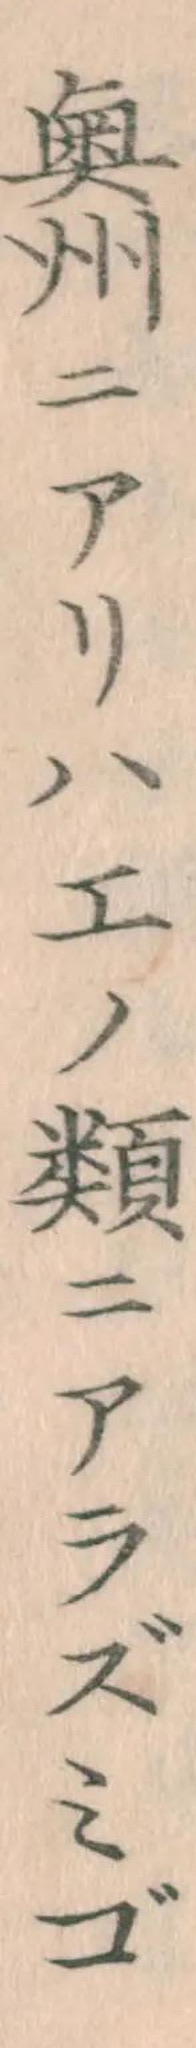奥州ニアリハエノ類ニアラズミゴ
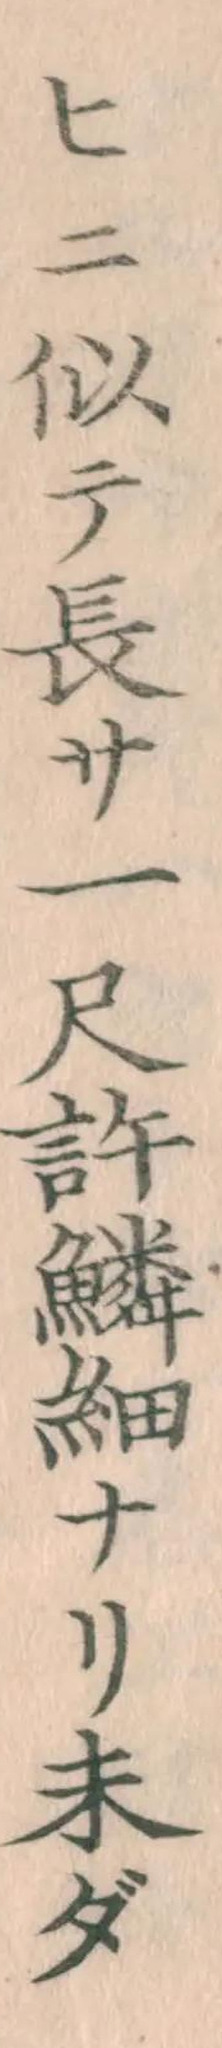ヒニ似テ長サ一尺許鱗細ナリ未ダ
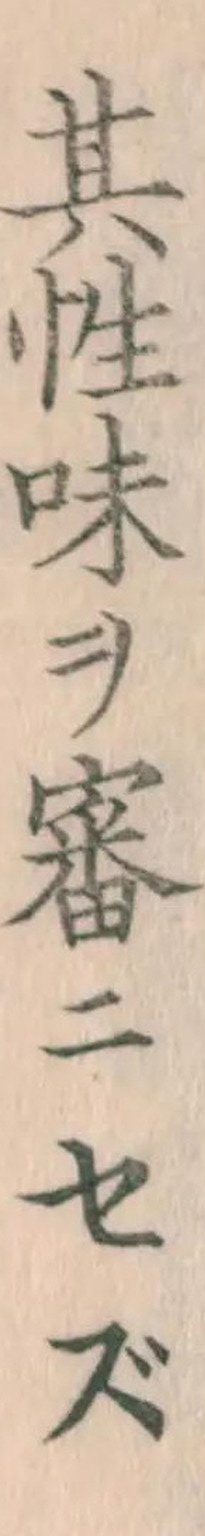其性味ヲ審ニセズ
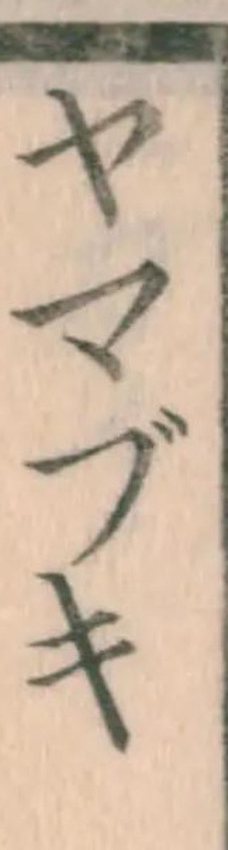ヤマブキ
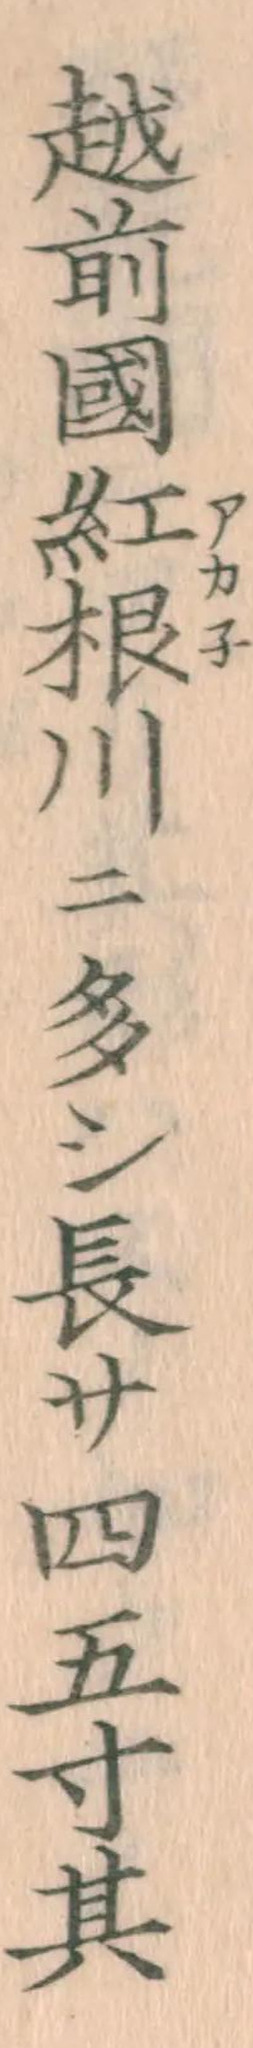越前国紅根川ニ多シ長サ四五寸其
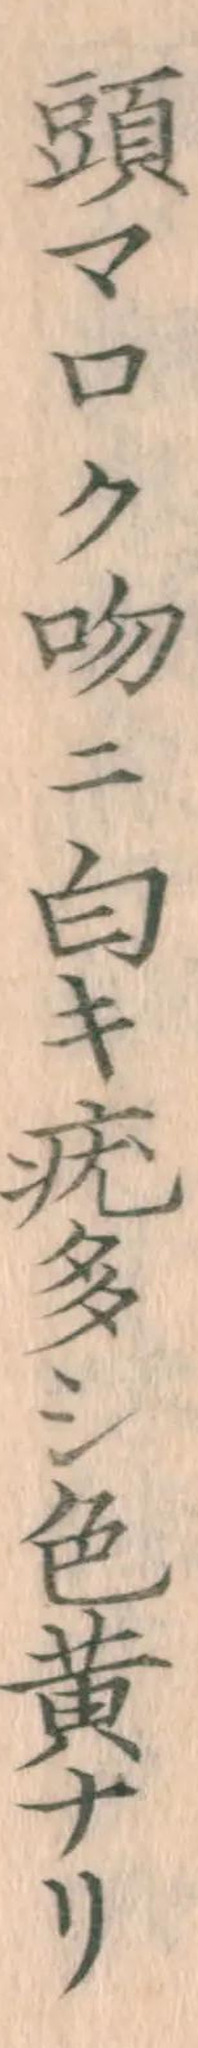頭マロク吻ニ白キ疣多シ色黄ナリ
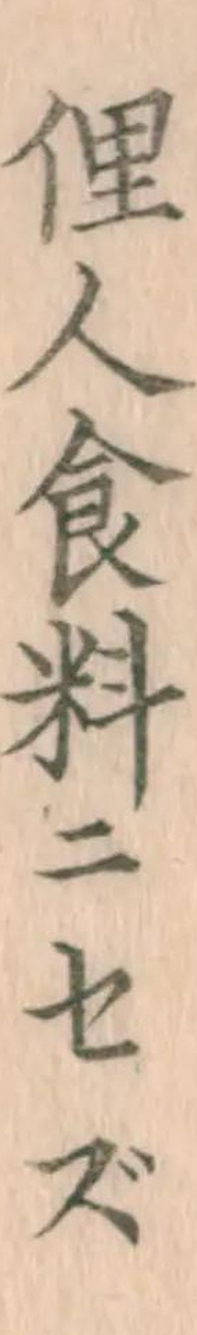俚人食料ニセズ

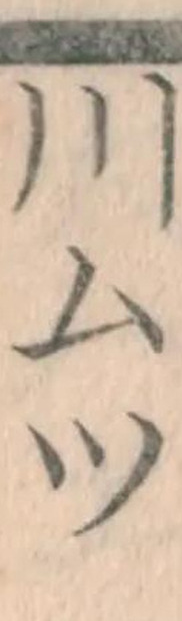川ムツ
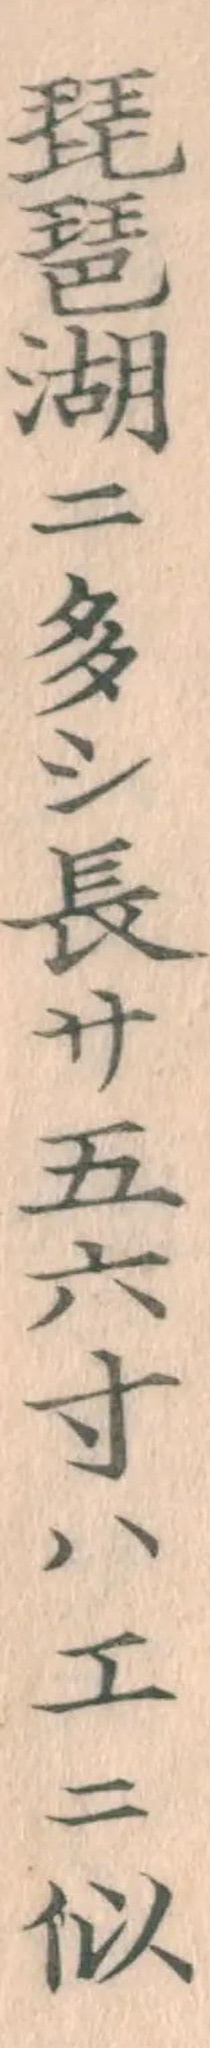琵琶湖ニ多シ長サ五六寸ハエニ似
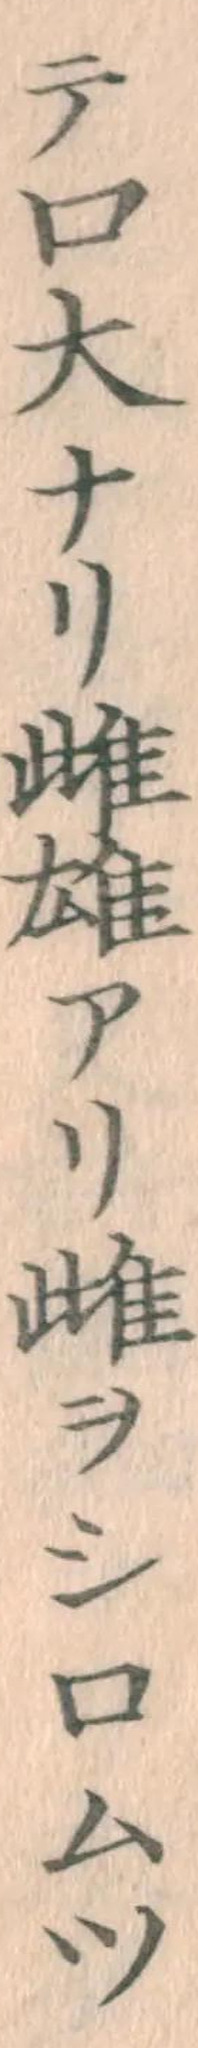テ口大ナリ雌雄アリ雌ヲシロムツ
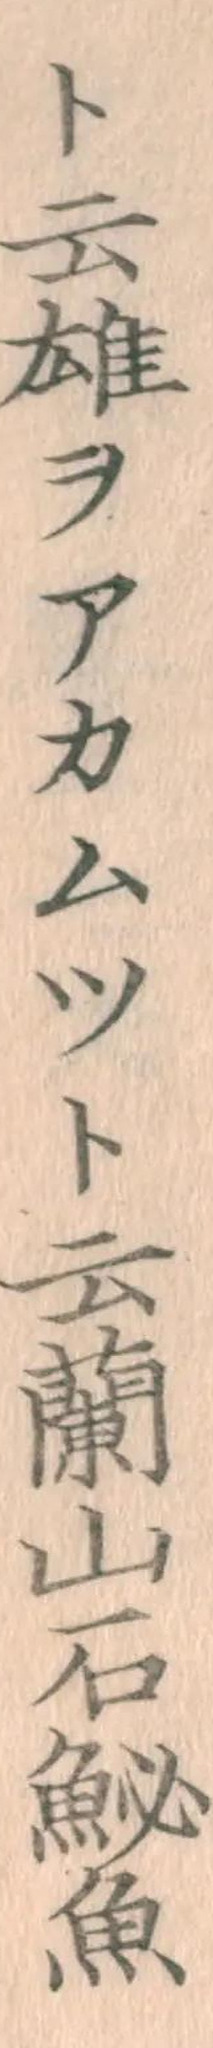ト云雄ヲアカムツト云蘭山石鮅魚
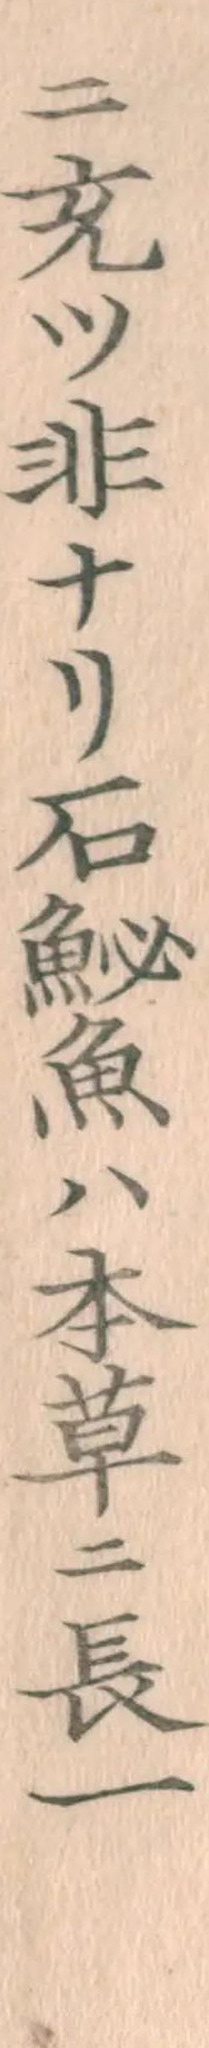ニ充ツ非ナリ石鮅魚ハ本草ニ長一
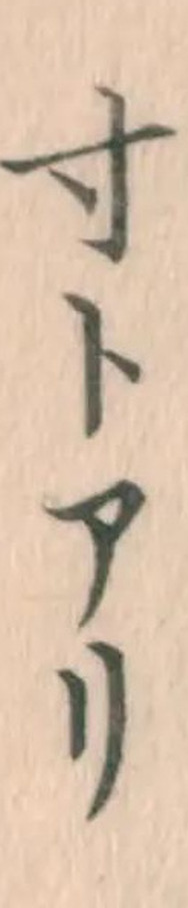寸トアリ
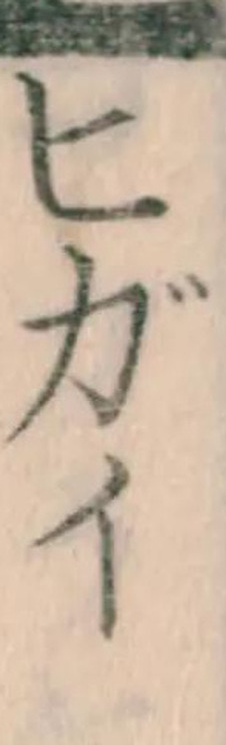ヒガイ
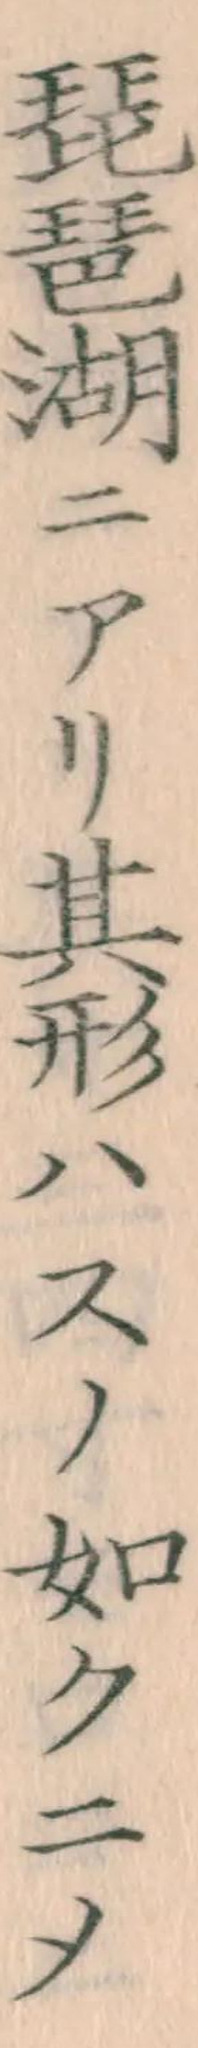琵琶湖ニアリ其形ハスノ如クニシテ
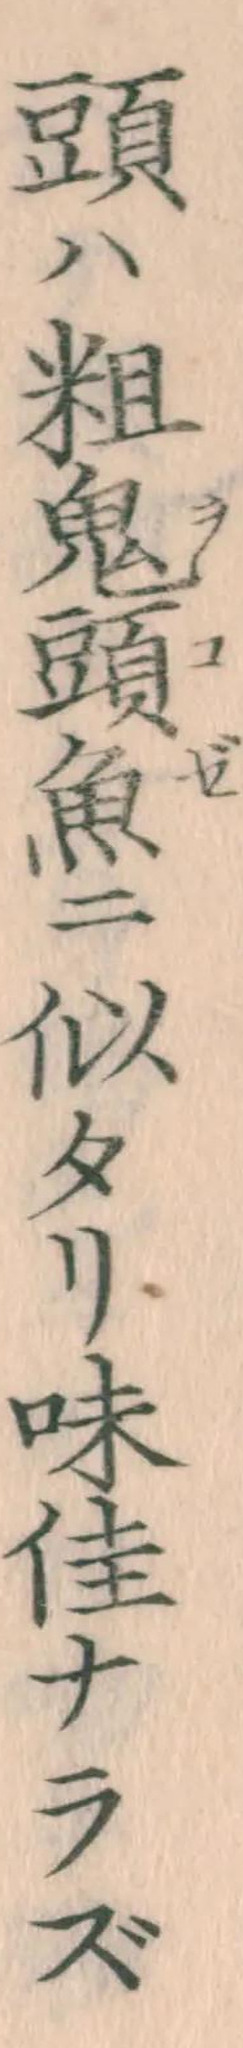頭ハ粗鬼頭魚ニ似タリ味佳ナラズ
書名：皇和魚譜 2巻
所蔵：国立国会図書館 National Diet Library, JAPAN
